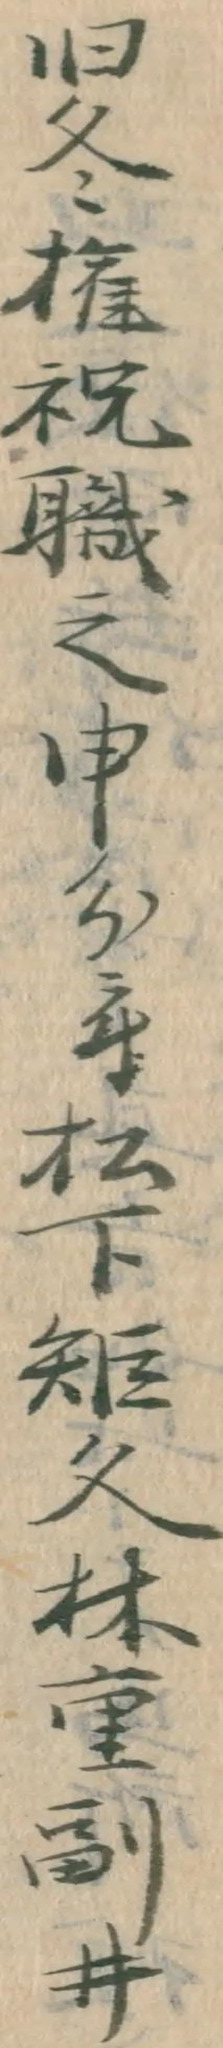旧冬権祝職之申分ニ付松下矩文林重副井
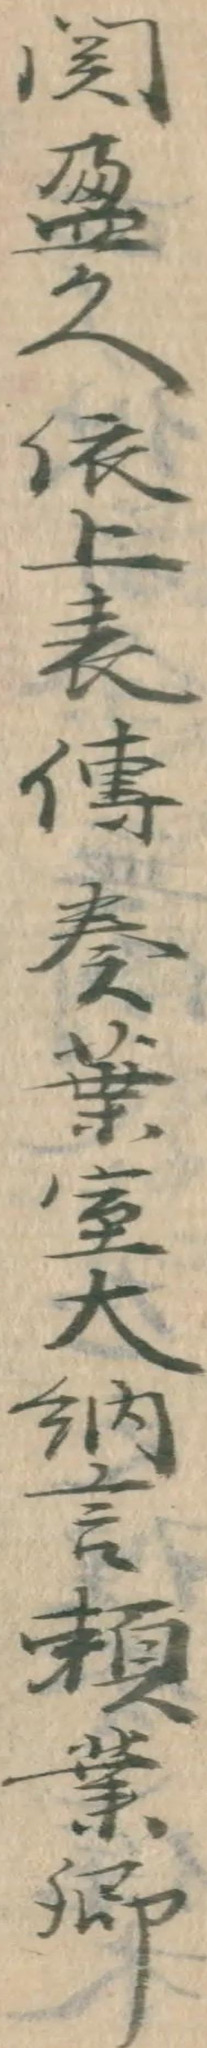関盈久依上表伝奏葉室大納言頼業卿
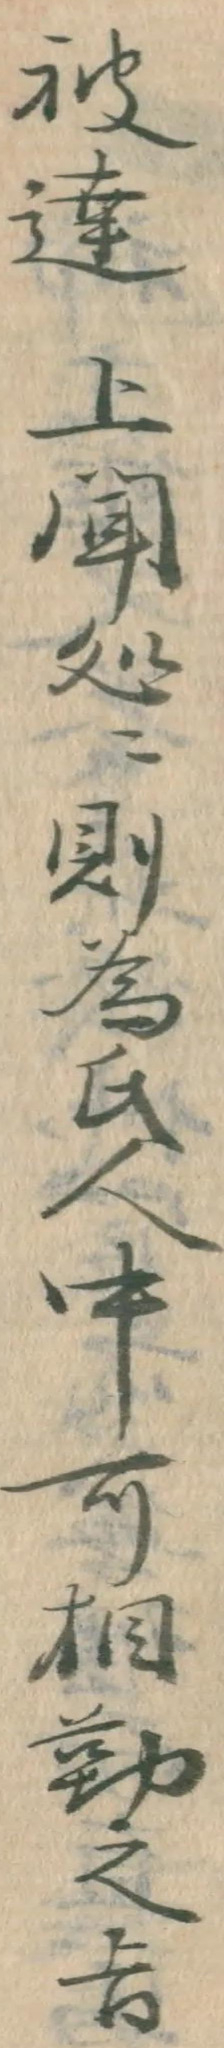被達上聞処ニ則為氏人中可相勤之旨
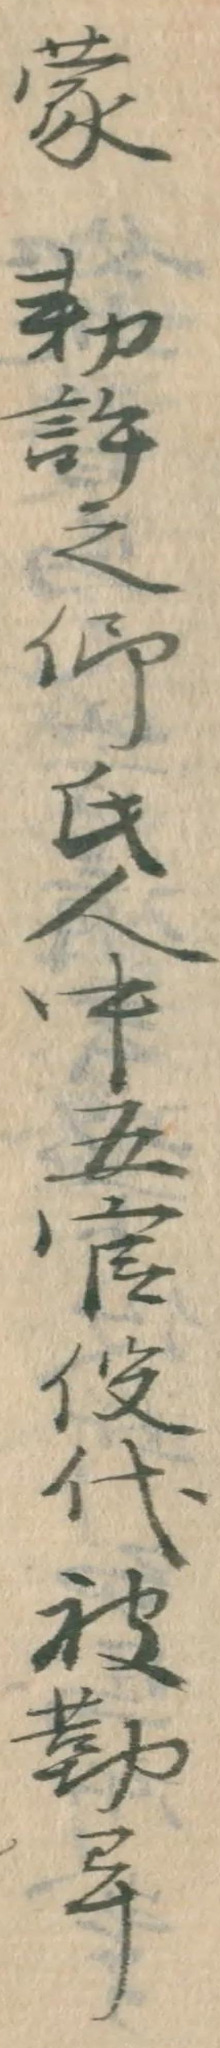蒙勅許之仰氏人中五官役代被勤畢
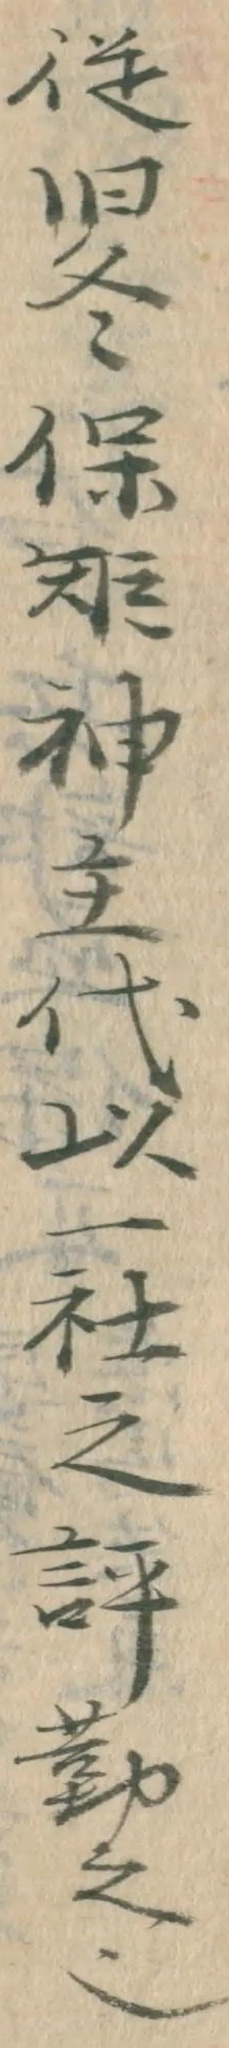従旧冬保矩神主代以一社之評勤之也
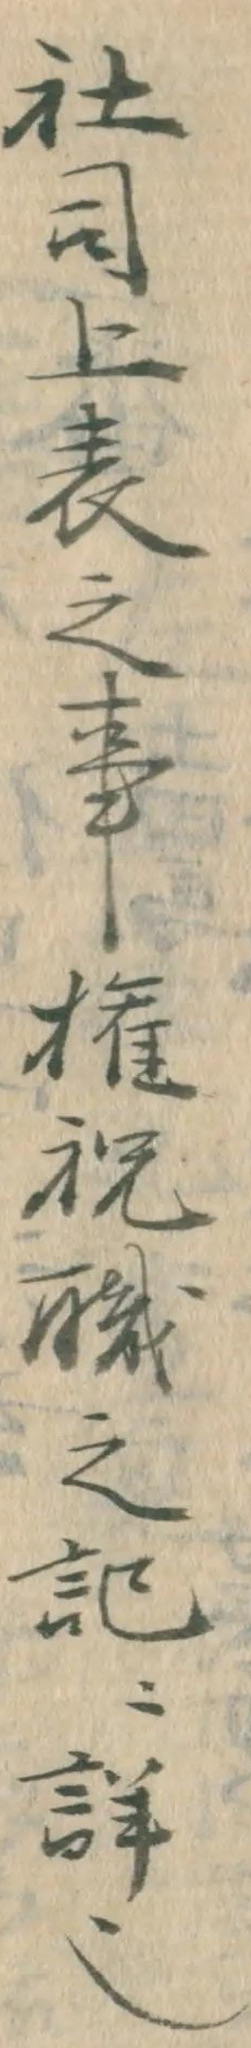社司上表之事権祝職之記二詳也
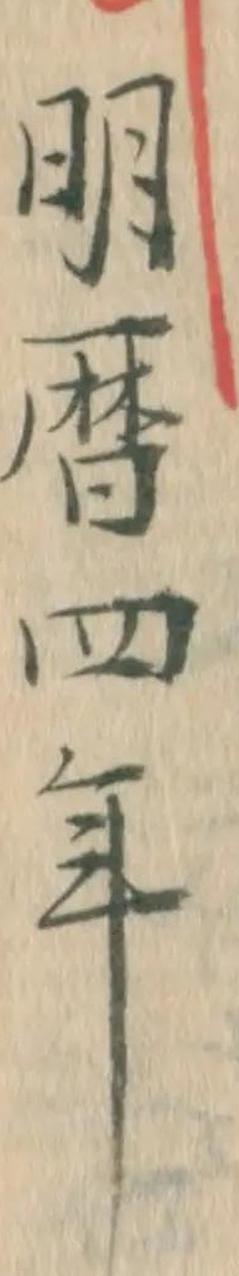明暦四年

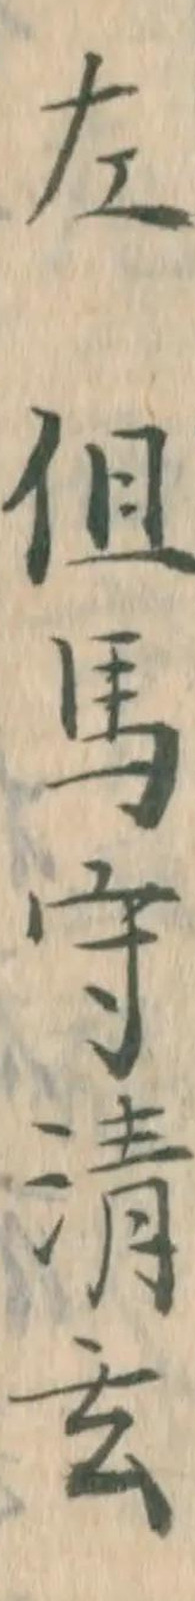左但馬守清玄
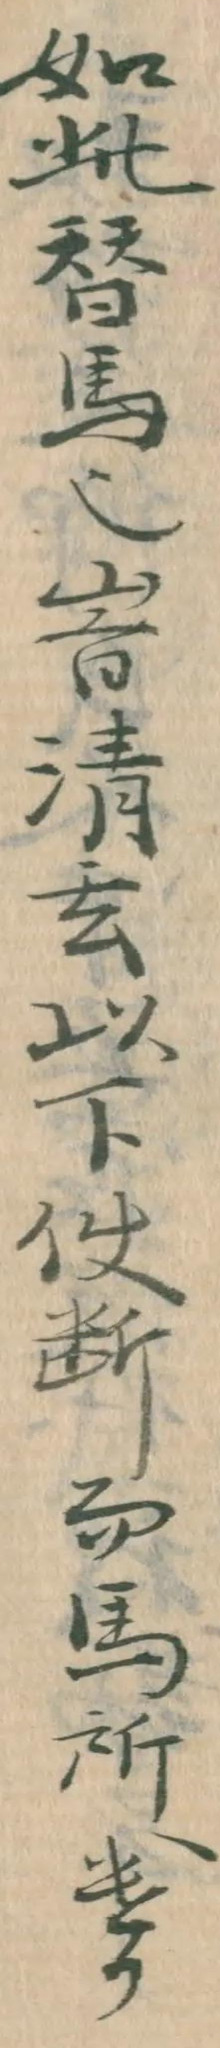如此替馬也旹清玄以下使断而馬所へ遣リ
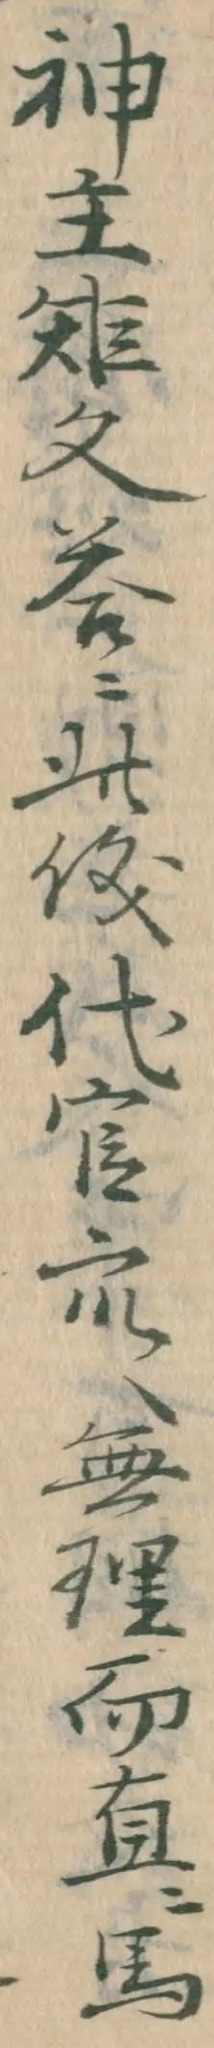神主矩文答ニ此儀代官衆へ無理而直ニ馬
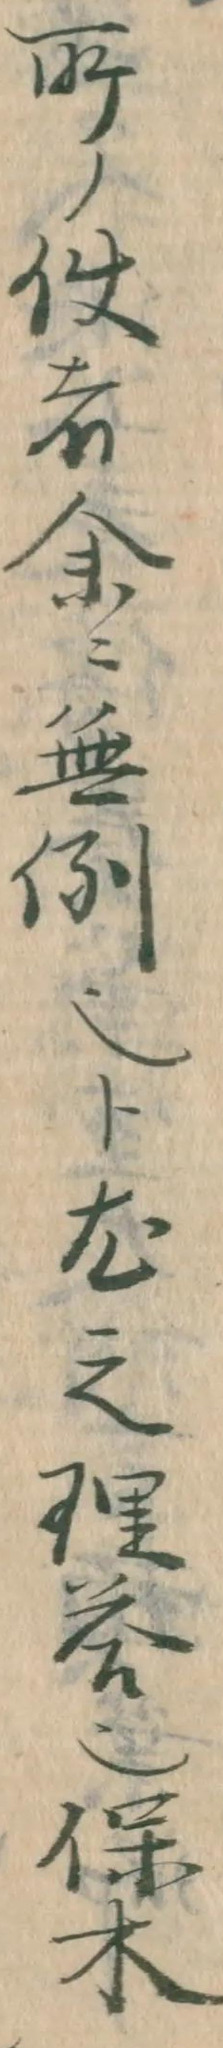所ノ使者余ニ無例也ト尤之理答也保木
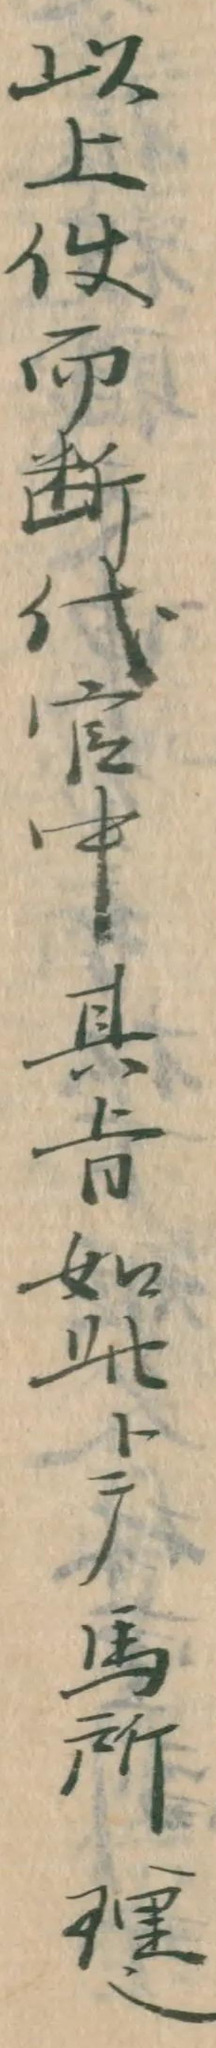以上使而断代官中其旨如此トテ馬所へ理也
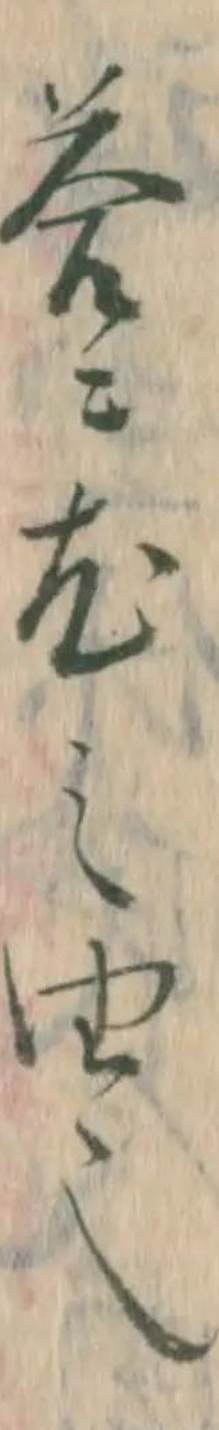答ニ尤之由也
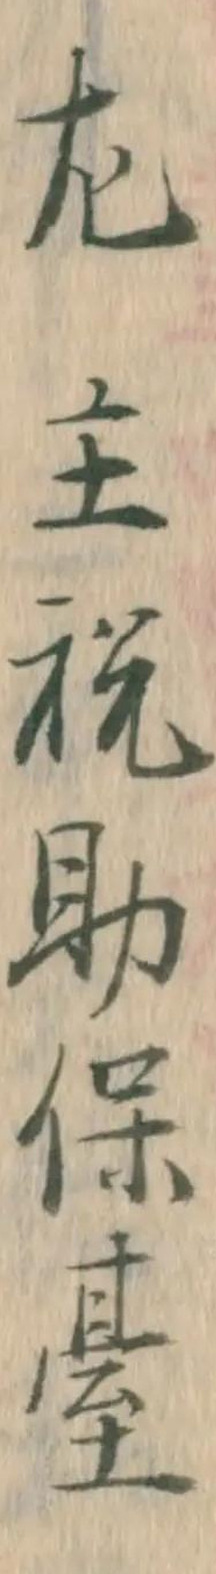左主税助保台
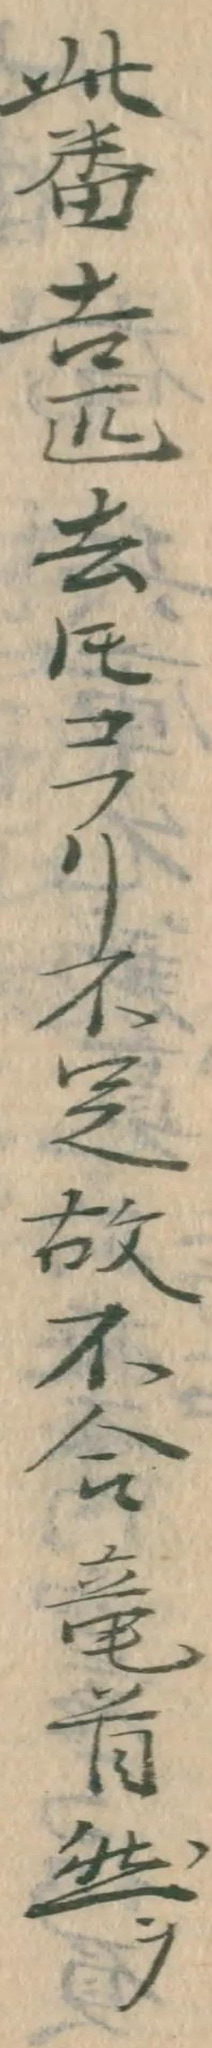此番吉匹去トモコフリ不足故不合竜首然ヲ
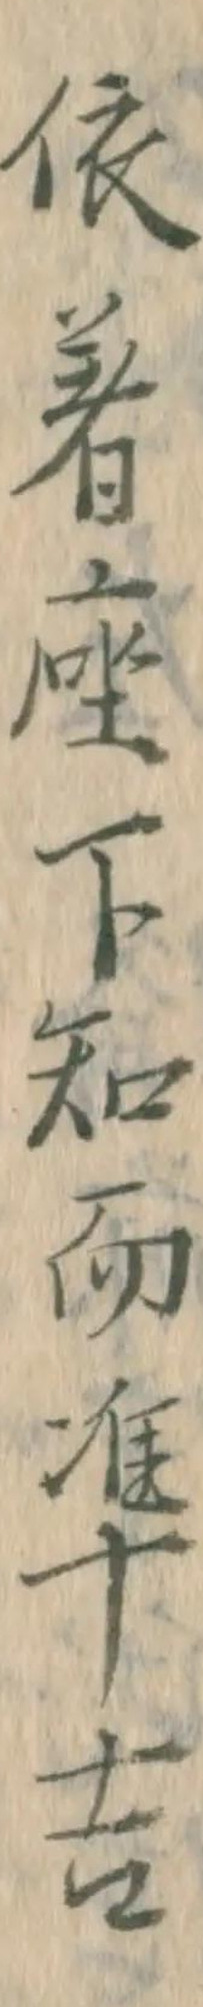依着座下知而準吉
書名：賀茂社記録. 第10冊
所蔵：国立国会図書館 National Diet Library, JAPAN
